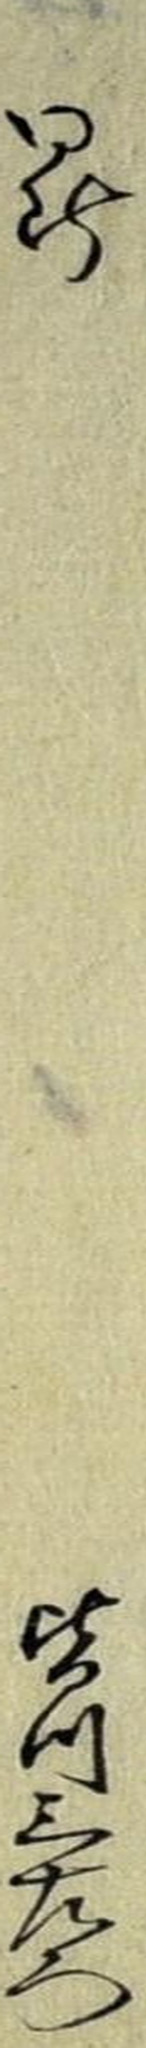同断皆川三左衛門
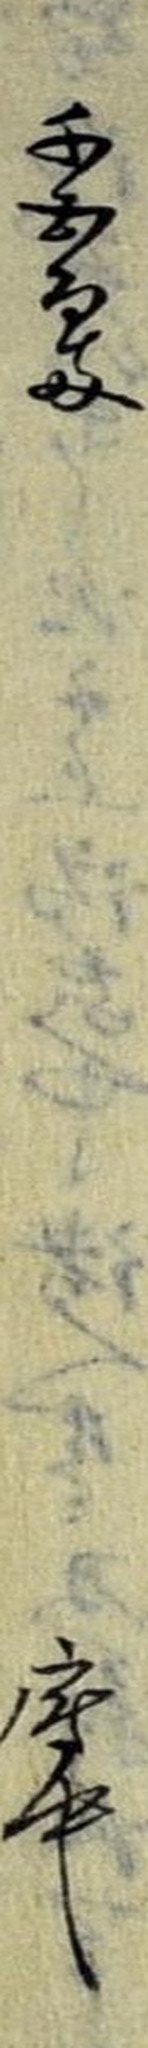千五百両府中
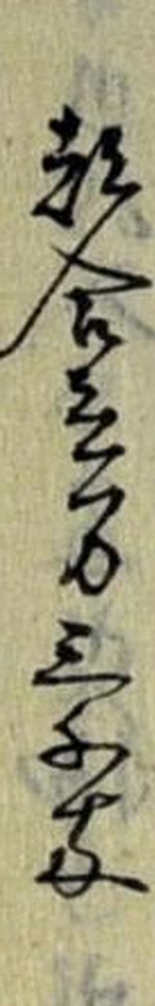都合壱万三千両
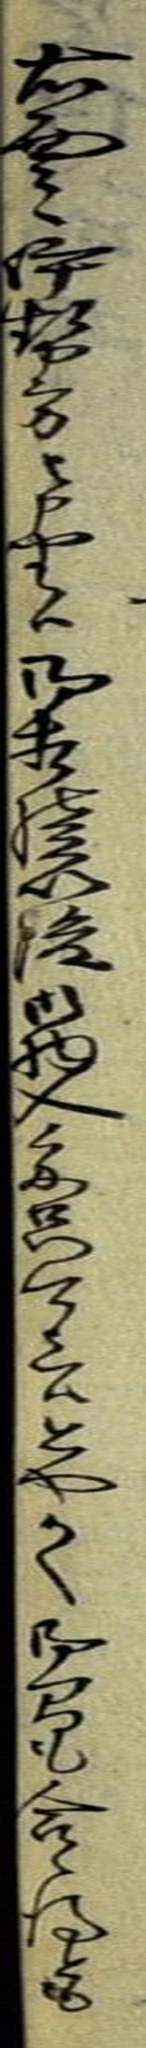右面々へ伊勢方被申聞候ハ御相続以後御物入多只今迄ハとやかく御間も合候得とも
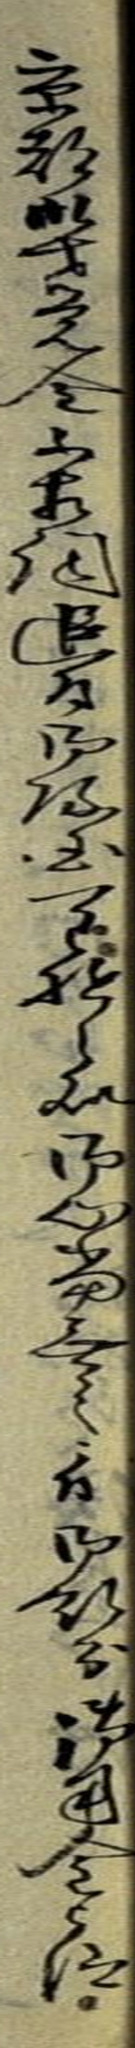京都御才覚金不相調追付御帰国可被遊候処御心当無之ニ付御領分御用金被仰
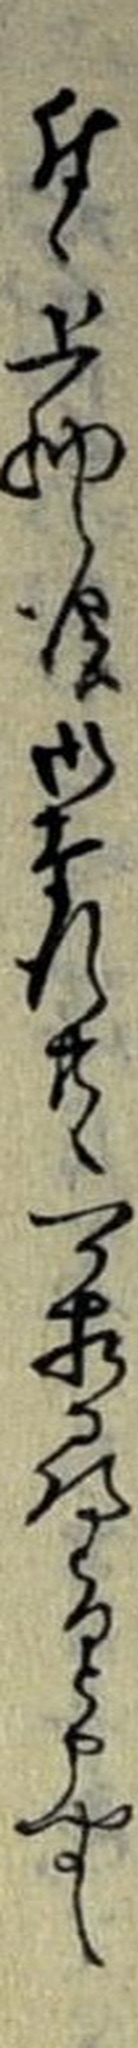付候上納之儀ハ奉行共へ可相尋旨被申聞候
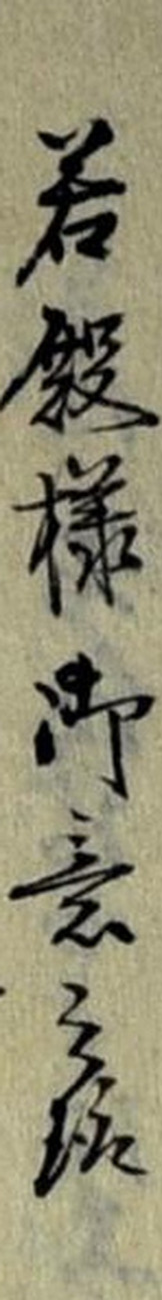若殿様御意之趣
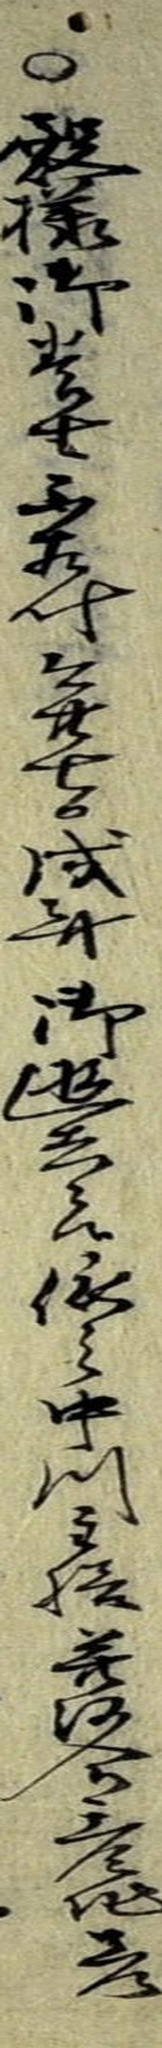〇殿様御養生不相叶今廿七日戌刻御逝去ニ候依之中川主膳并河合彦作差
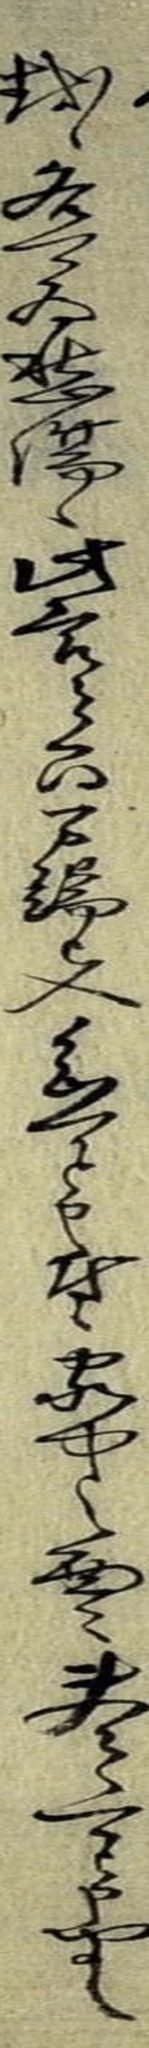越候各可為愁傷候此節ニ候間万端被入念可被申付候家中之面々夫々へ可被申聞候
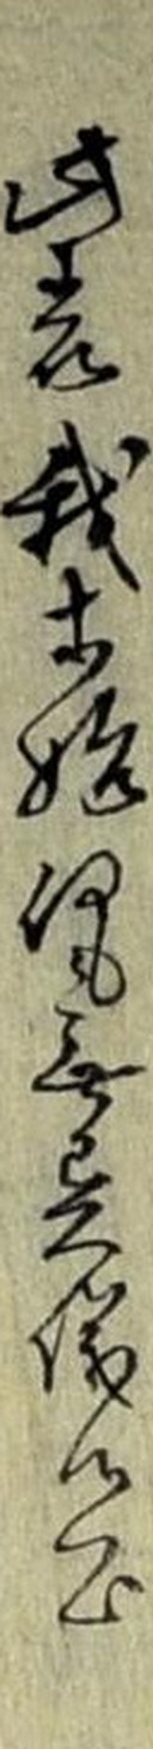此表我等始何も無異儀候以上
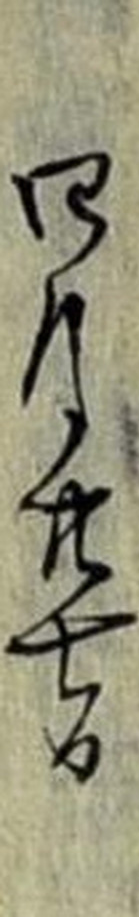四月廿七日
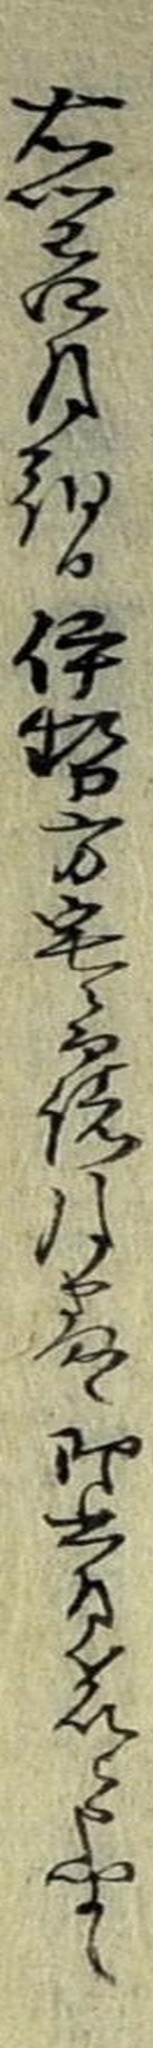右閏四月朔日伊勢方宅ニ而諸月番へ御書付を以被申聞候
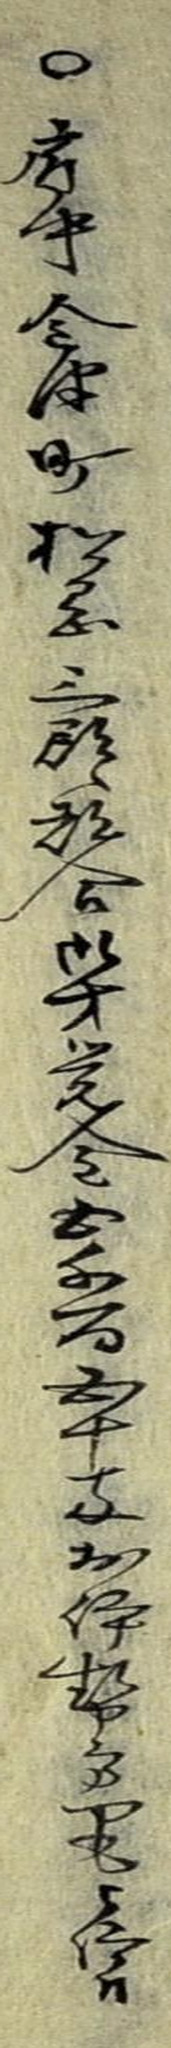〇府中金津町松岡三郡へ都合御才覚金五千百五十両於伊勢方宅被仰付
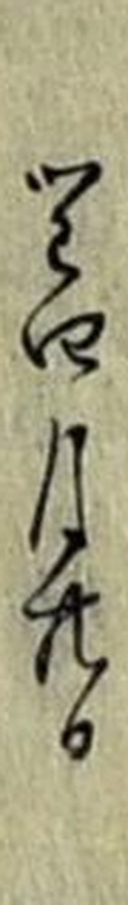閏四月廿日
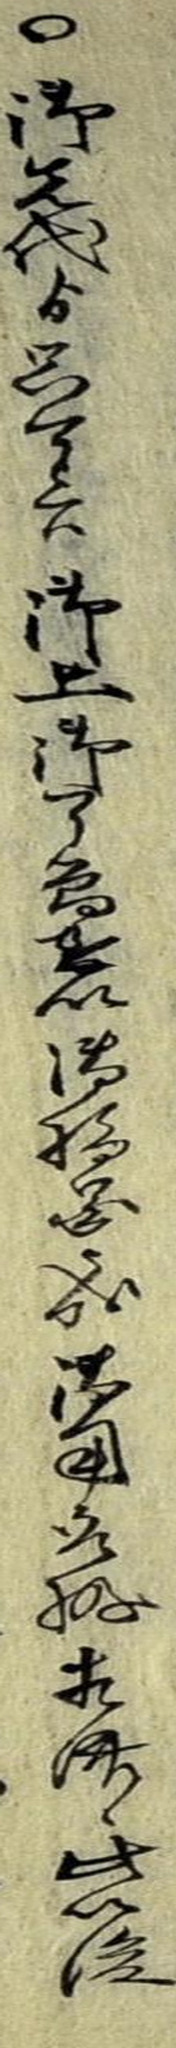〇御先代ゟ只今迄ハ御上御了簡を以御指図被成御用取扱相済候此以後
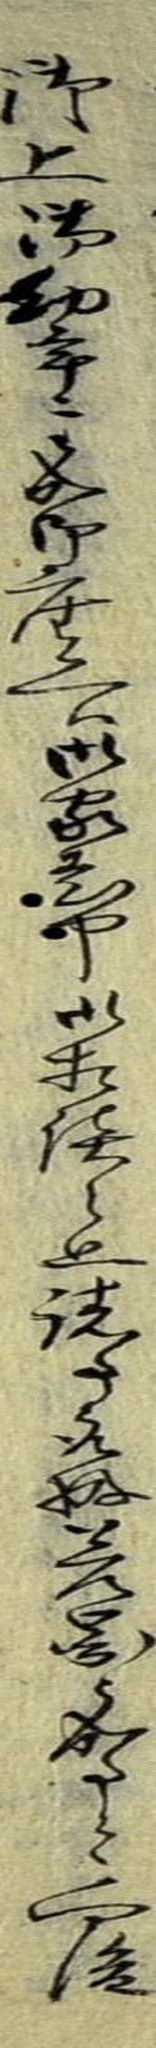御上御幼年ニ被成御座候ヘハ御家老中御相談之上諸事取扱差図被成事ニ候向後
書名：命令之部 一
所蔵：福井県文書館 Fukui Prefectural Archives
